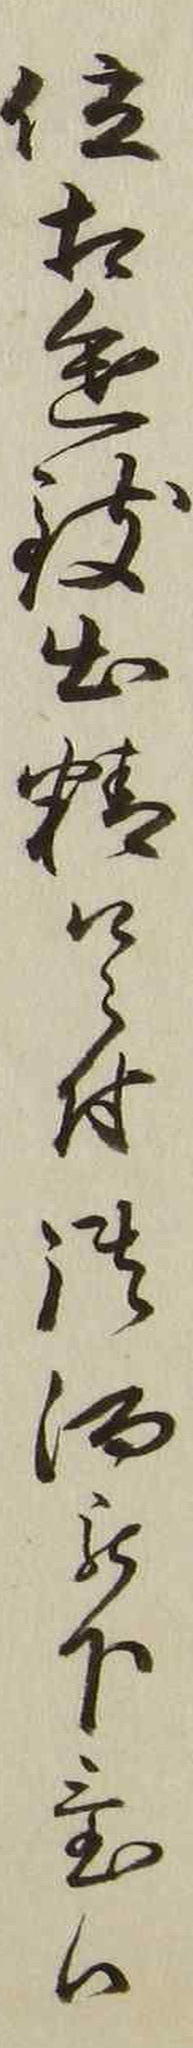位相進致出精候ニ付御酒被下置候
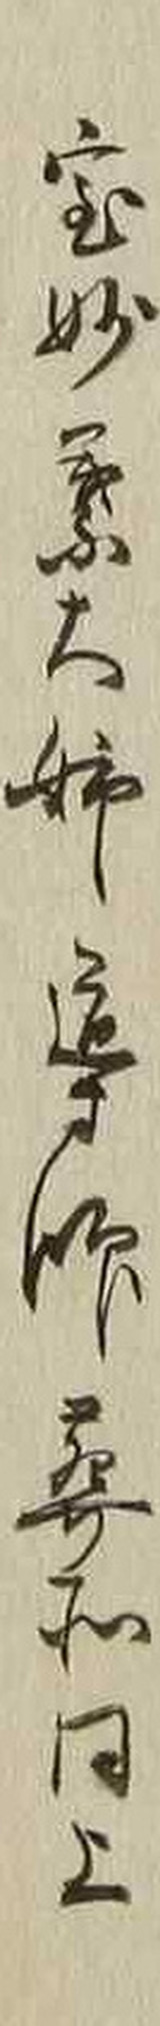宝妙葉大姉導師葬所同上
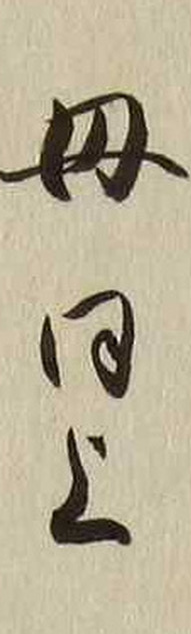母同上
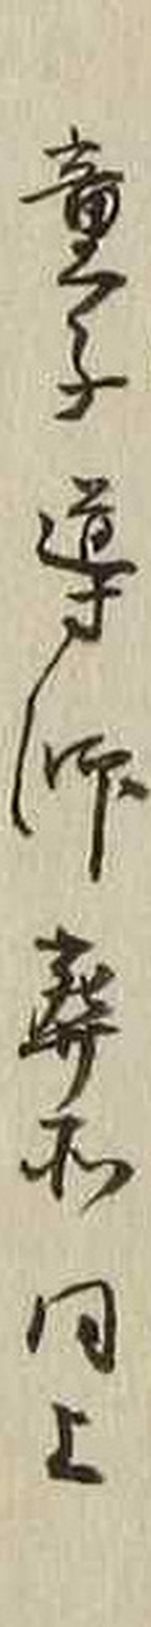童子導師葬所同上
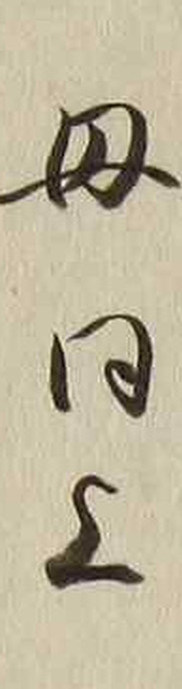母同上
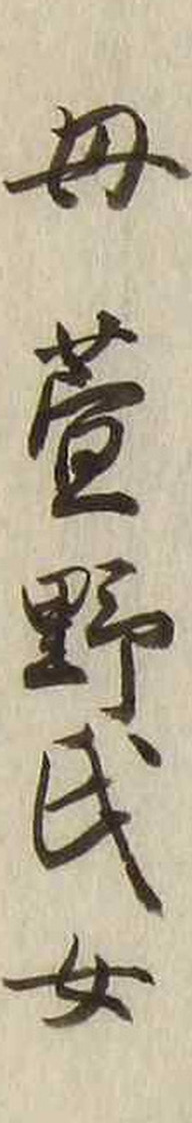母萱野氏女

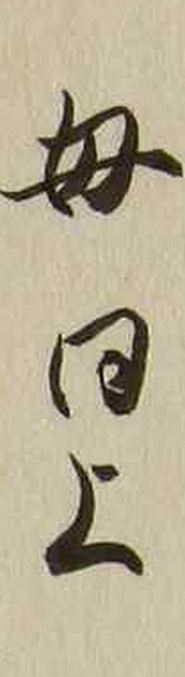母同上
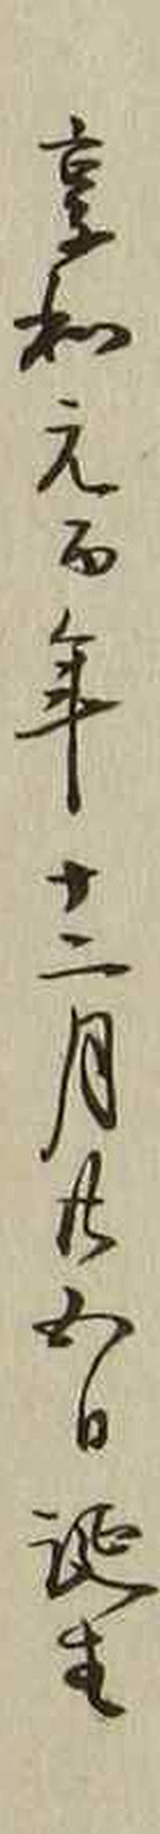享和元酉年十二月廿五日誕生
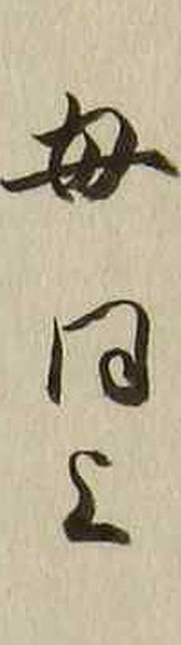母同上
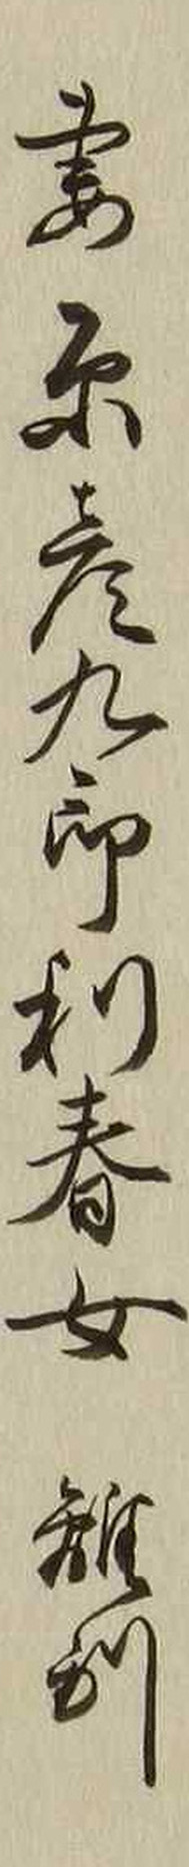妻原彦九郎利春女雉別
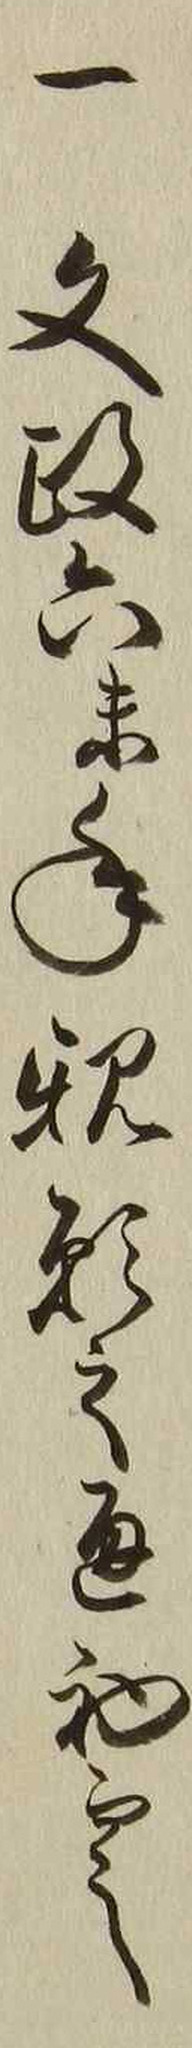一文政六未年親願之通初而之
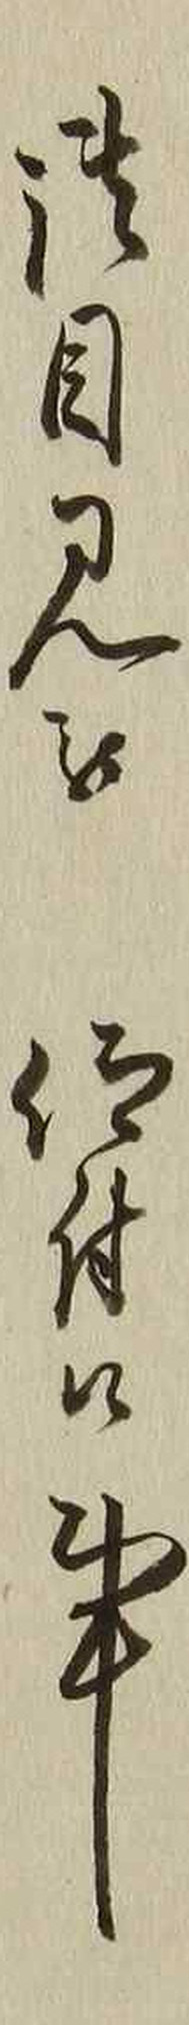御目見被仰付候事
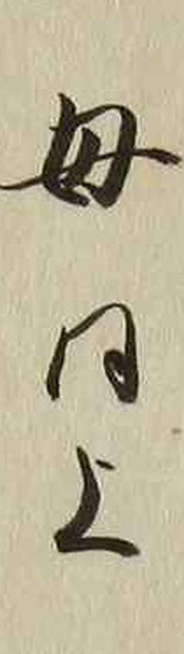母同上
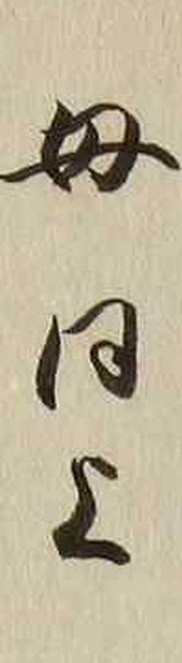母同上
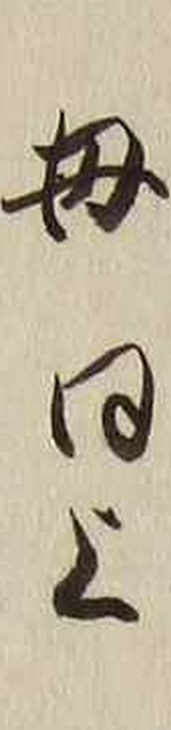母同上
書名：諸士系譜　巻之21　い之部21
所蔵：会津若松市立会津図書館
